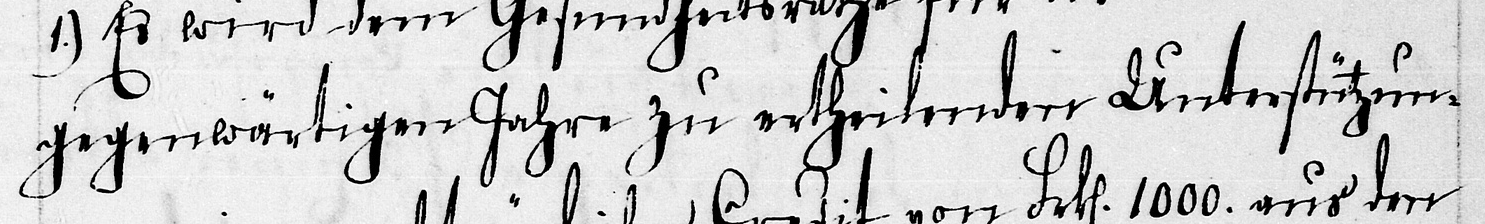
gegenwärtigen Jahre zu ertheilenden Unterstützun¬
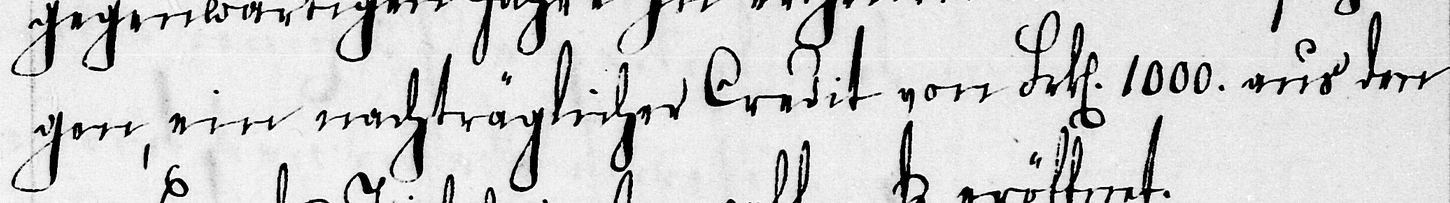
gen, ein nachträglicher Credit von Frk[en]. 1000. aus den
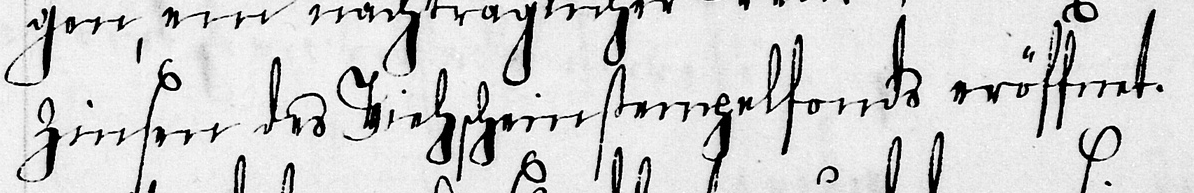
Zinsen des Viehscheinstempelfonds eröffnet.
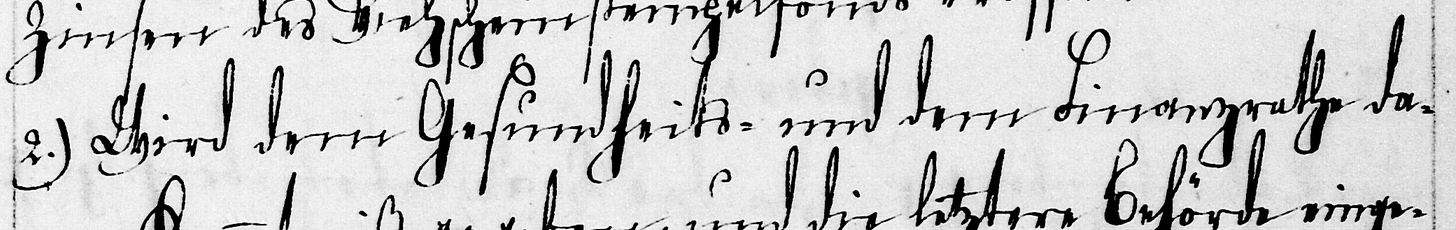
2.) Wird dem Gesundheits- und dem Finanzrath da¬
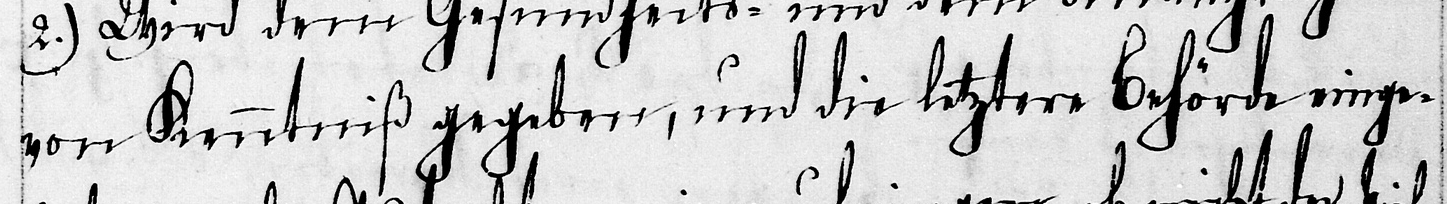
von Kenntniß gegeben, und die letztere Behörde einge¬
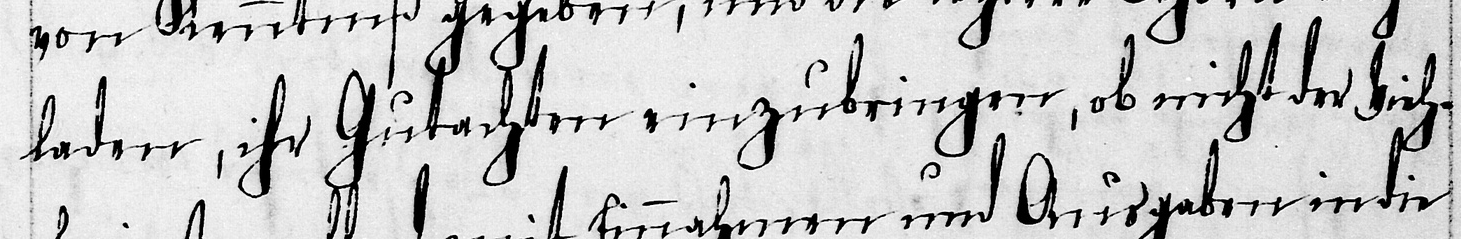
laden, ihr Gutachten einzubringen, ob nicht der Vieh¬
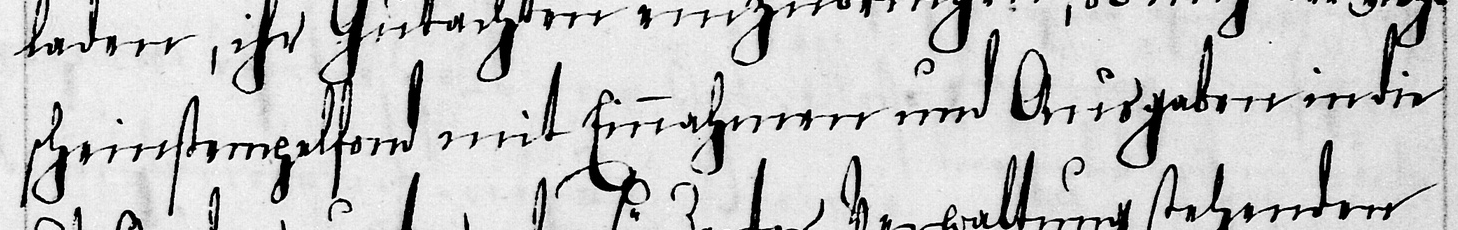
scheinstempelfond mit Einnahmen und Ausgaben in die
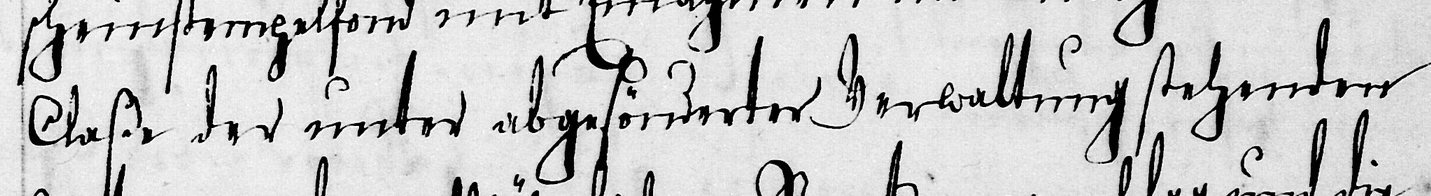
Claße der unter abgesönderter Verwaltung stehenden
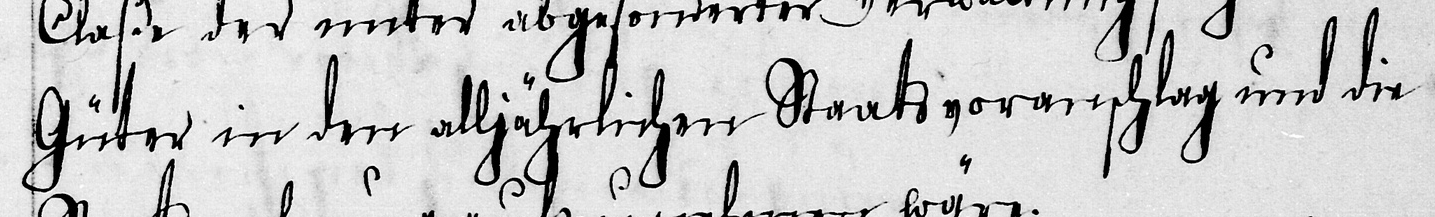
Güter in den alljährlichen Staatsvoranschlag und die
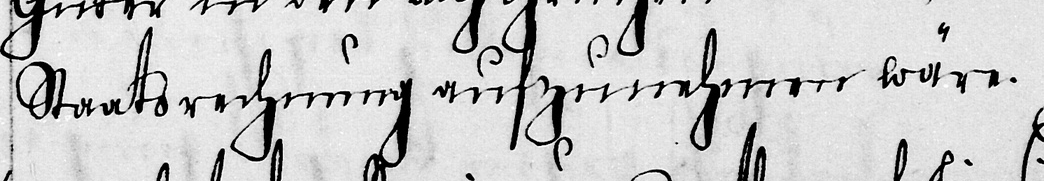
Staatsrechnung aufzunehmen wäre.
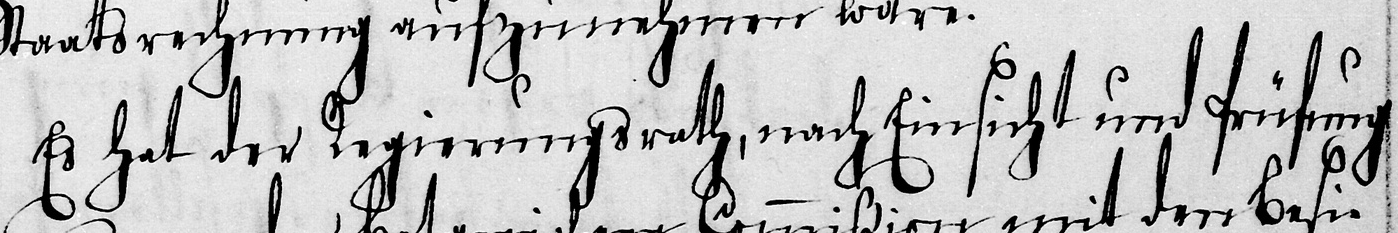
Es hat der Regierungsrath, nach Einsicht und Prüfung
